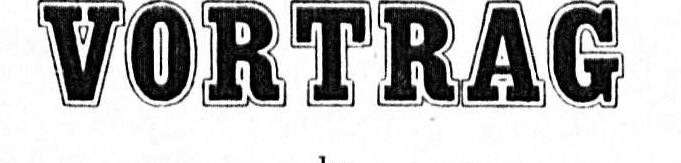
VORTRAG
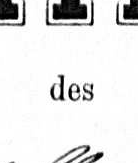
des
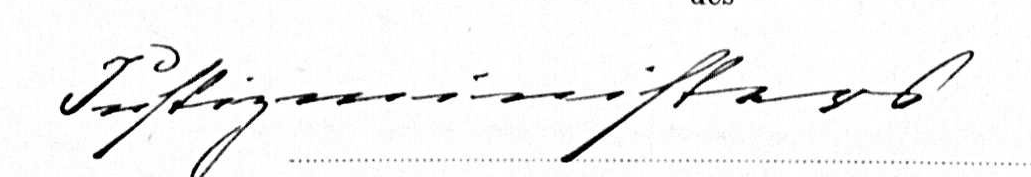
Justizministers
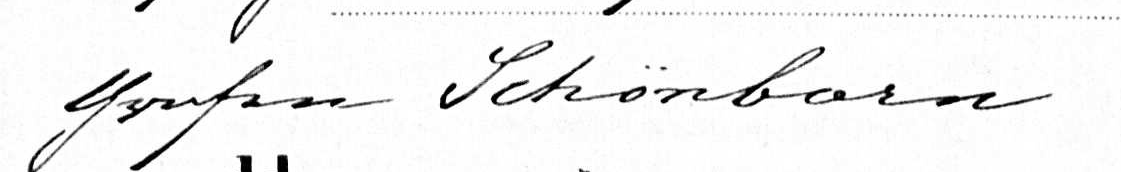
Grafen Schönborn
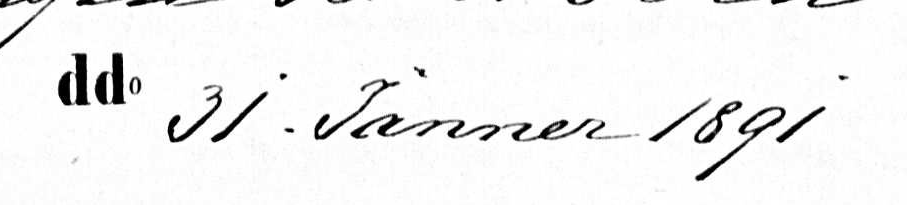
Ddo 31 Jänner 1891
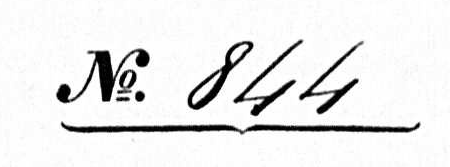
No 844
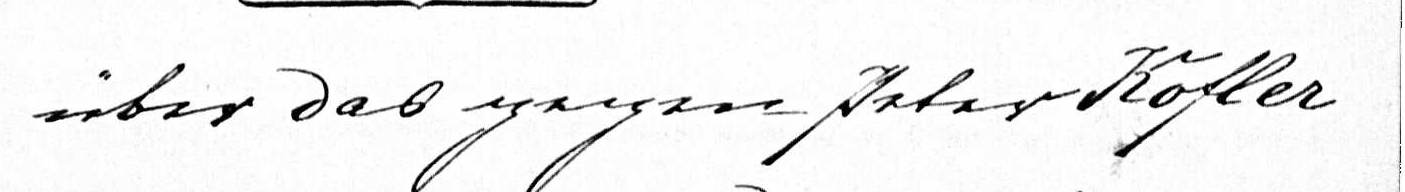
Über das gegen Peter Kofler
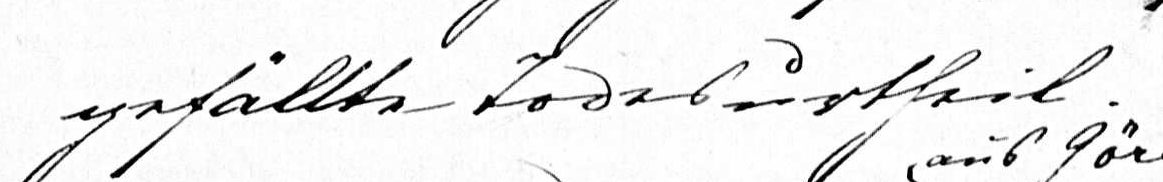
gefällte Todesurtheil.
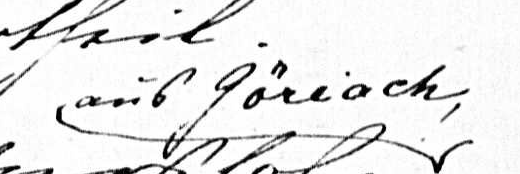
aus Göriach,
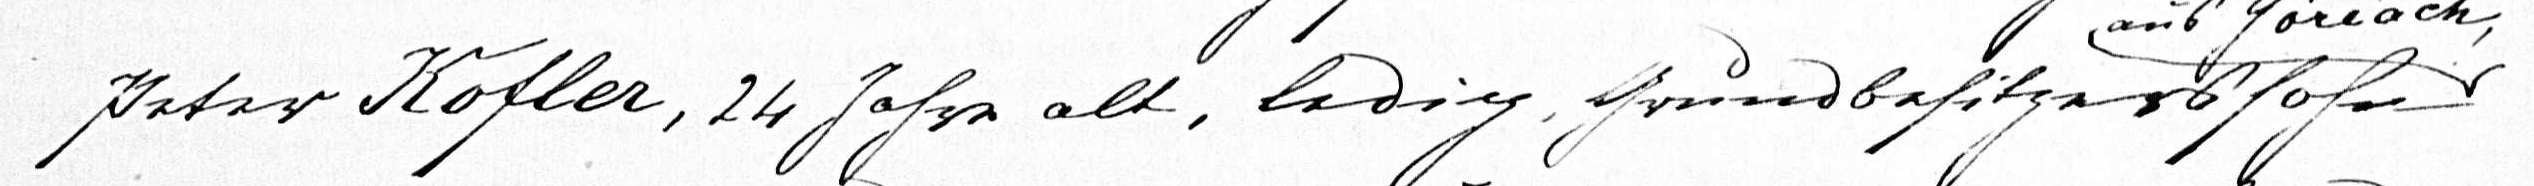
Peter Kofler, 24 Jahre alt, ledig, Grundbesitzersohn
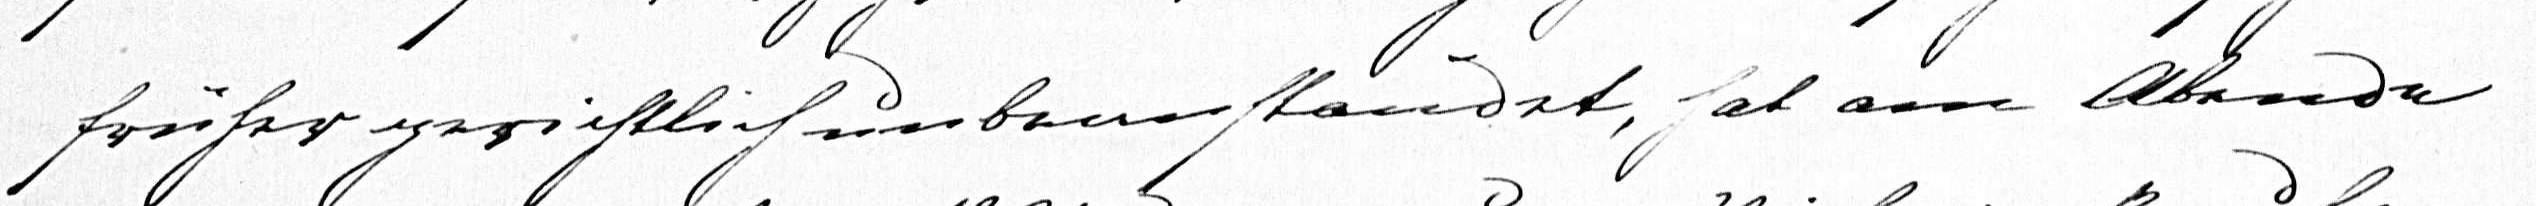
früher gerichtlich unbeanstandet, hat am Abende
